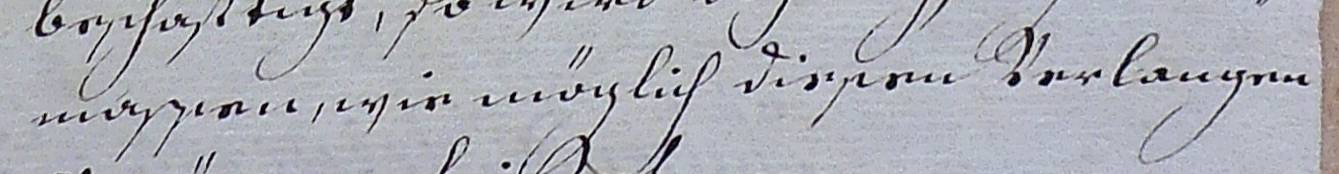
massen, wir möglich diesen Verlangen
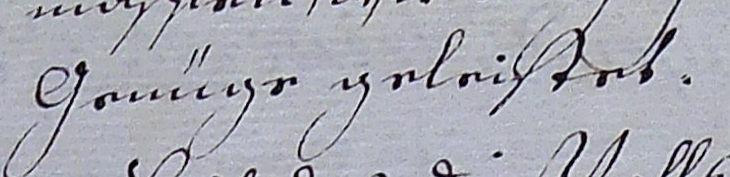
Genüge geleistet.
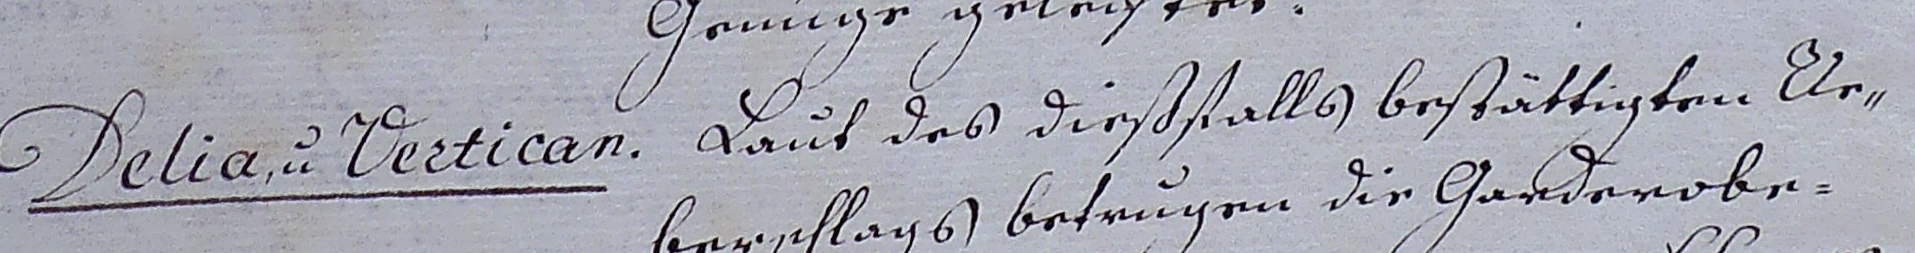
Delia, u Vertican. Laut des dießfalls bestättigten Ue¬
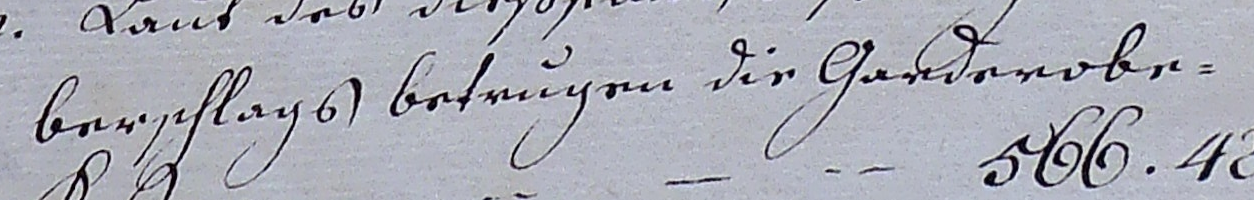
berschlags betrugen die Garderobe¬
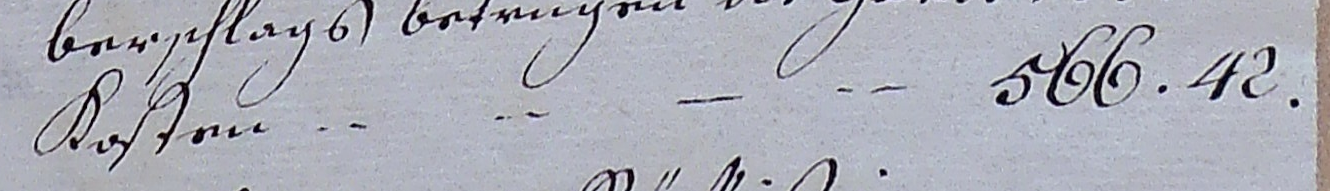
Kosten .. .. .. .. 566. 42.
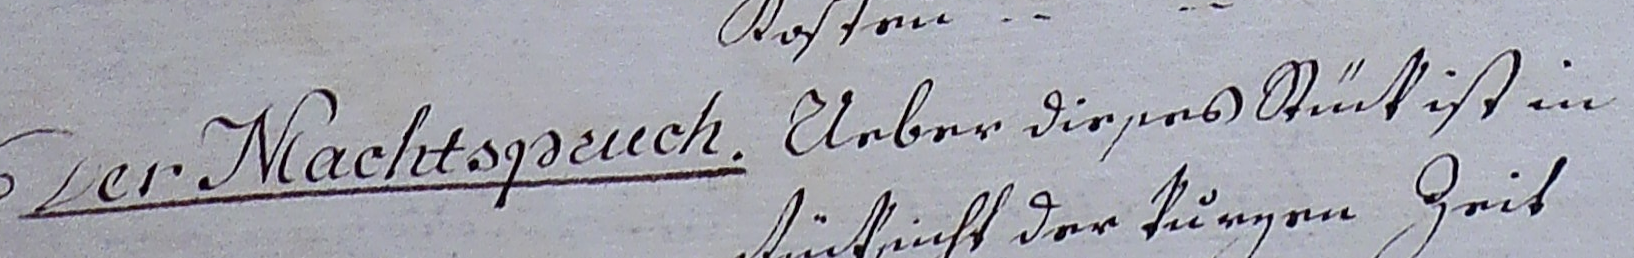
Der Machtspruch. Ueber dieses Stück ist in
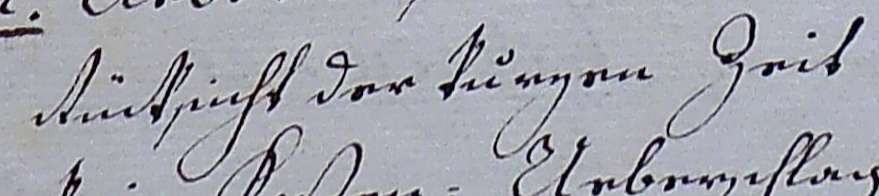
Rücksicht der kurzen Zeit
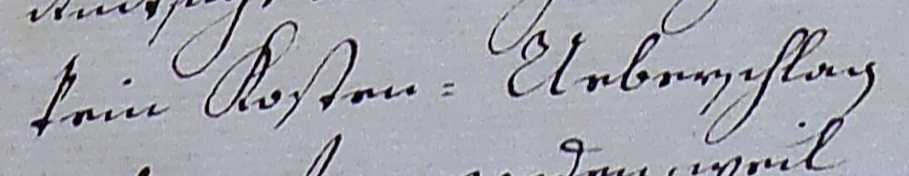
kein Kosten= Ueberschlag
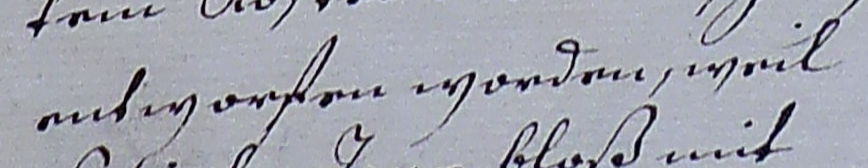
entworfen worden, weil
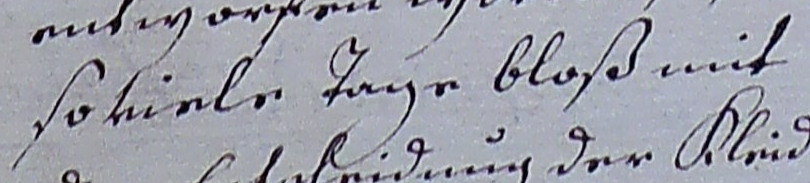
soviele Tage bloß mit
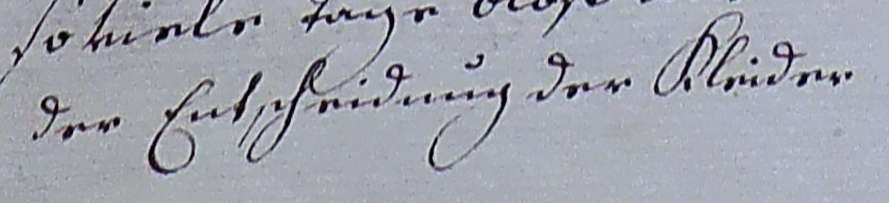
der Entscheidung der Kleider
